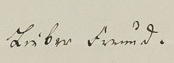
Lieber Freund.
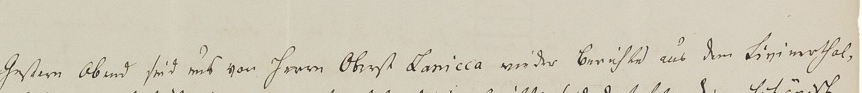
Gestern Abend sind uns von Herrn Oberst Lanicca wieder Berichte aus dem Livinerthal,
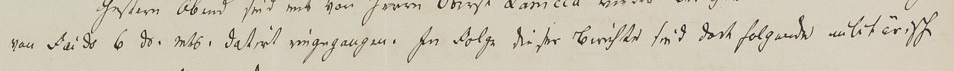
von Faido6 ds. Mts. datirt eingegangen. In Folge dieser Berichte sind dort folgende militärischen
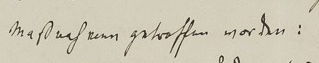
Massnahmen getroffen worden:
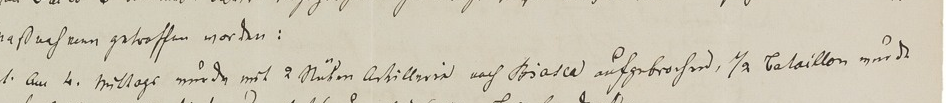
1. Am 4. Mittags wurde mit 2 Stüken Artillerie nach Biasca aufgebrochen, ½ Bataillon wurde
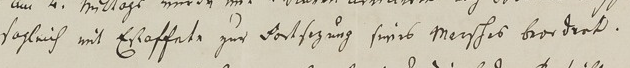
sogleich mit Estaffete zur Fortsezung seines Marsches beordert.
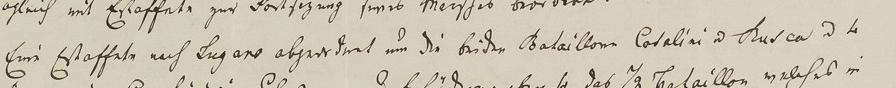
Eine Estaffete nach Lugano abgeordert um die beiden Bataillone Caselini u Rusca u 4
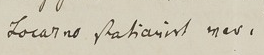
Locarno stationirt war.
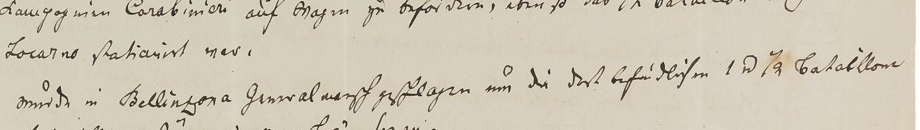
wurde in Bellinzona Generalmarsch geschlagen um die dort befindlichen 1 u ½ Bataillone
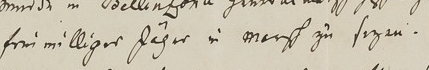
freiwilliger Jäger in Marsch zu sezen.
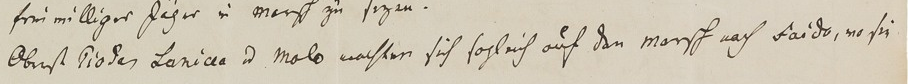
Oberst Pioda, Lanicca u Molo machten sich sogleich auf den Marsch nach Faido, wo sie
